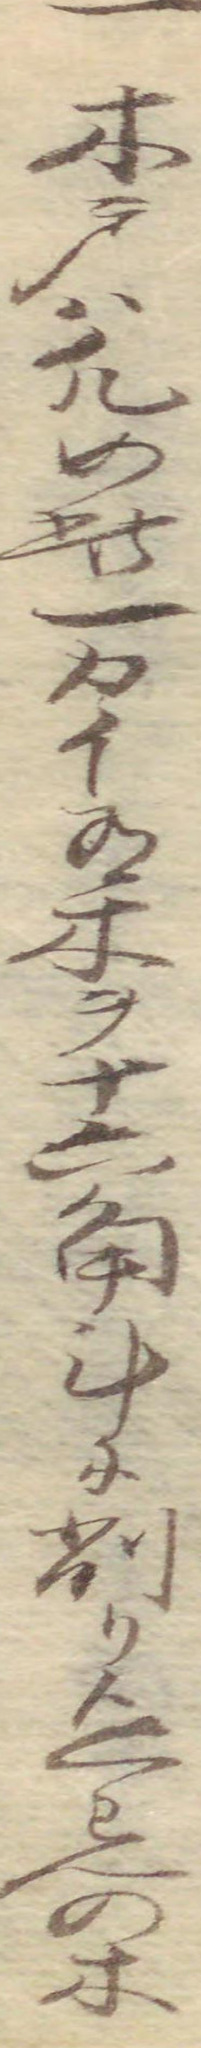一木戸ハ凡如此一カイ有木ヲ十六角斗に削り候くわんの木
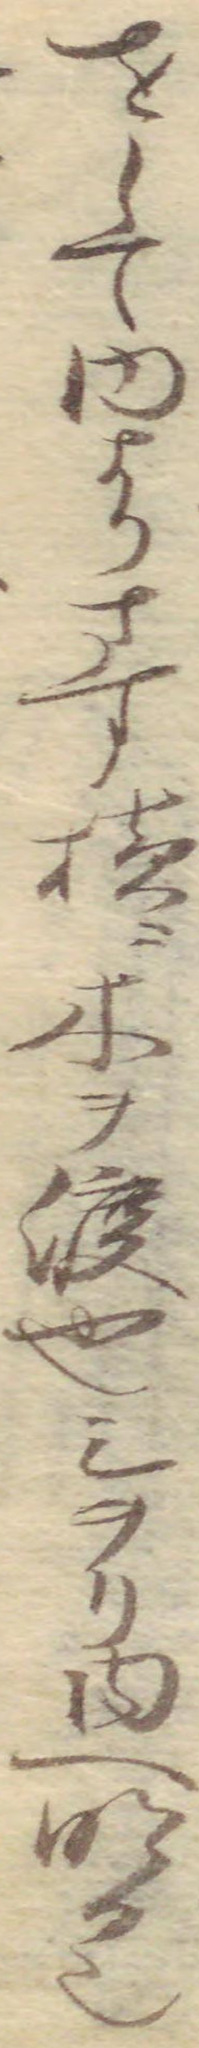をして内よりさす横ニ木ヲ渡也シヲリ内へ明る也
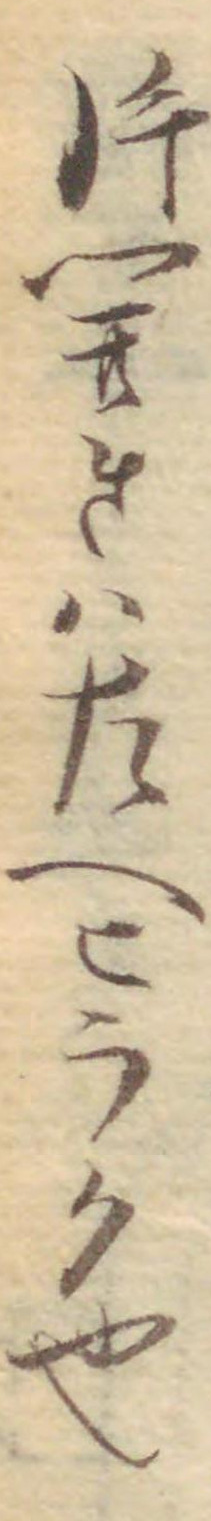片開きハ左へヒラク也

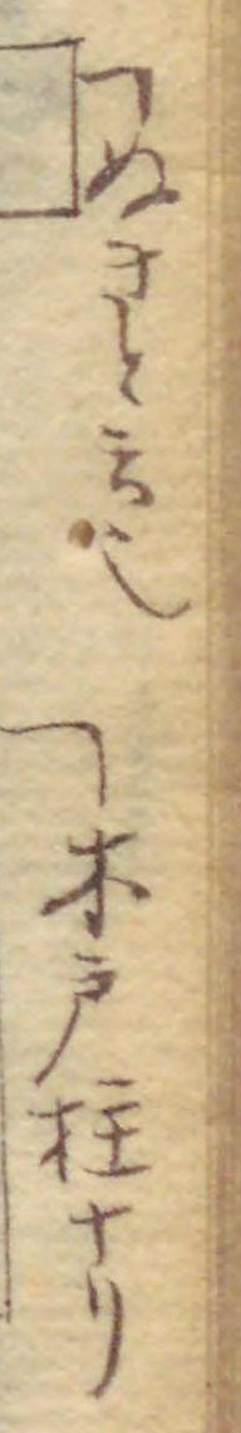ぬきと云也木戸柱ナリ
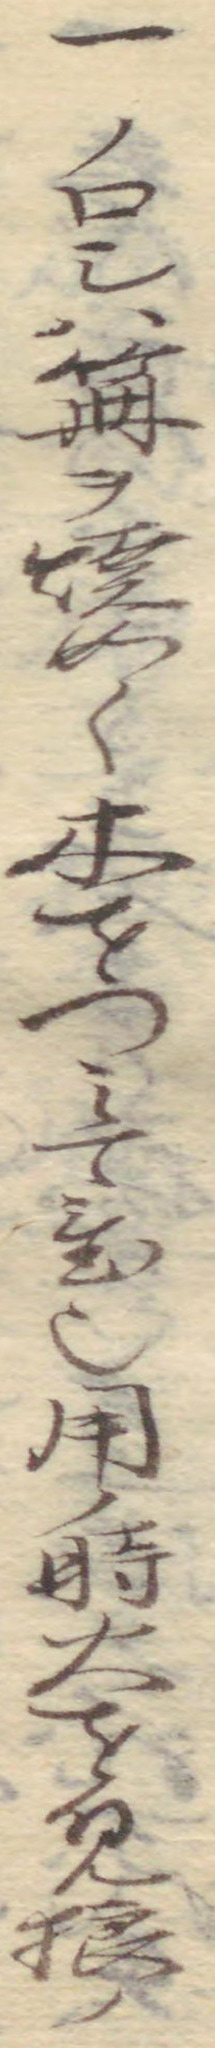一ノロシハ篝ヲ焼如く木をつミて置也用ノ時火を付ル狼ノ
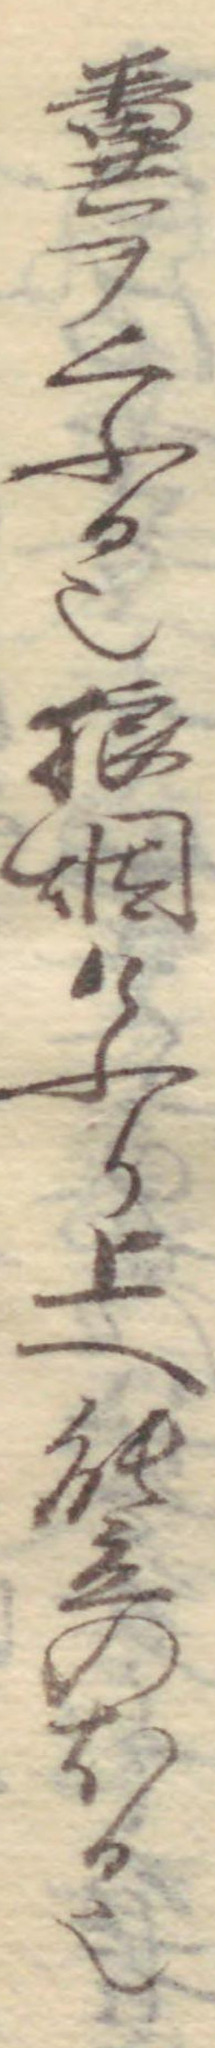糞ヲくふる也狼烟けふり上へ能立のほる也
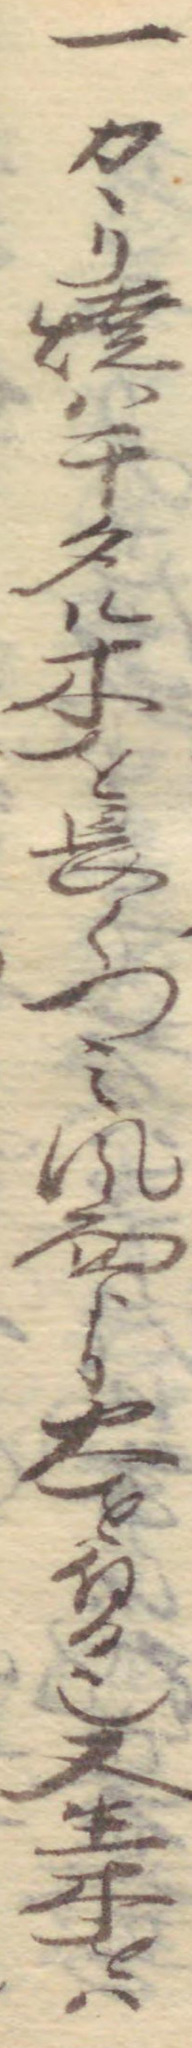一カヽリ焼ハ干タル木を長くつミ風面より火を付る也又生木をハ
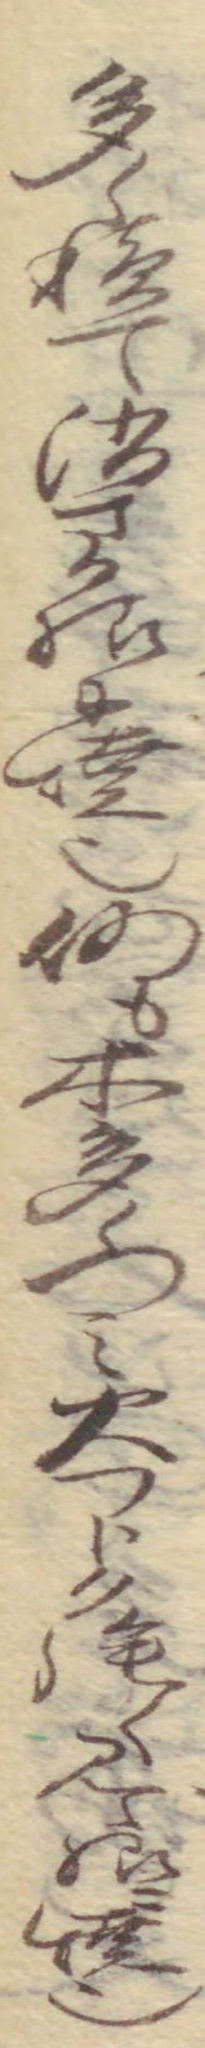多く積て消さる様に焼也何も木多くつミ火フトク強く見候様ニ焼也
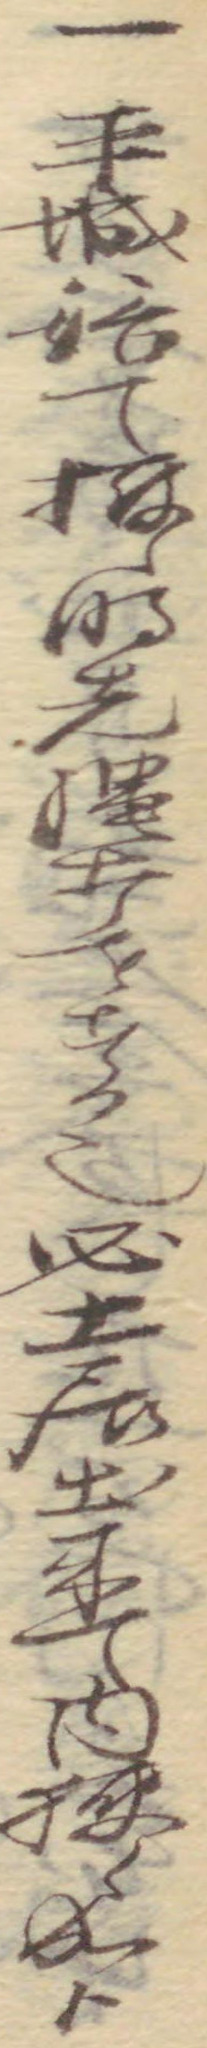一平城ハ始て拵候時先縄打をする也必土居出来て内狭く成候
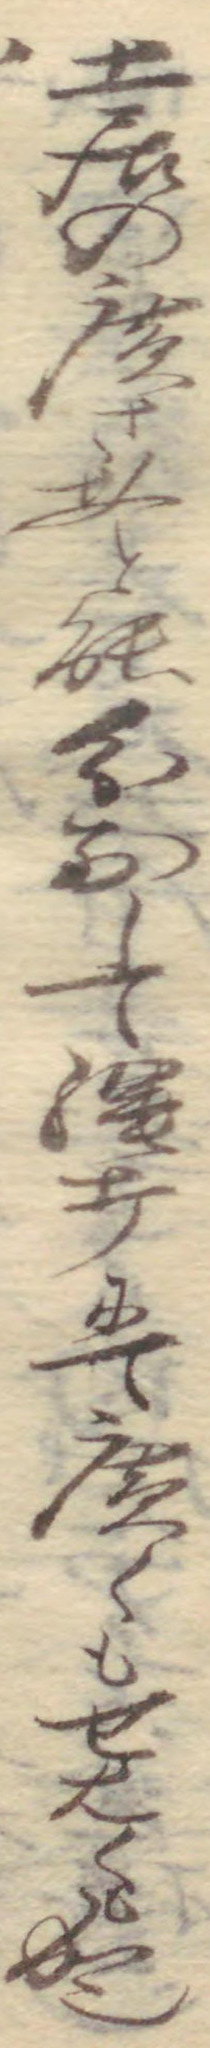土居の広さなと能分別して縄打にて広くもせはくも成也
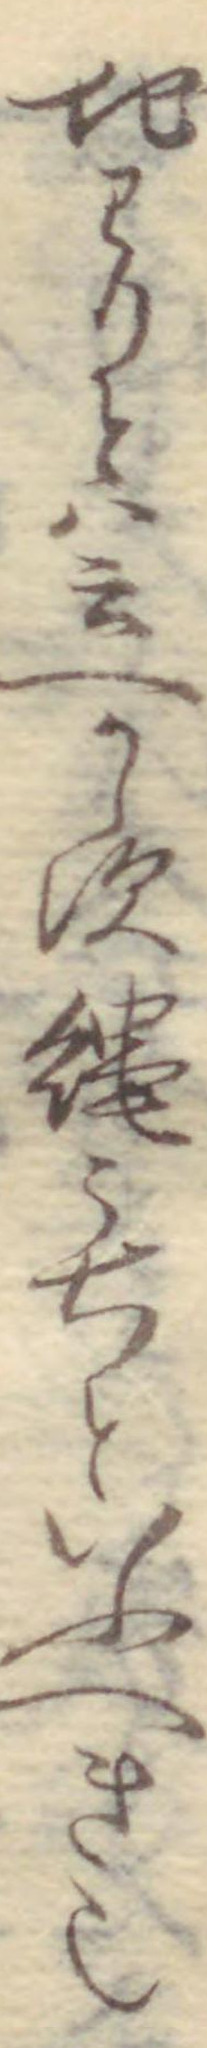地わりとハ云へからす縄うちといふへき也
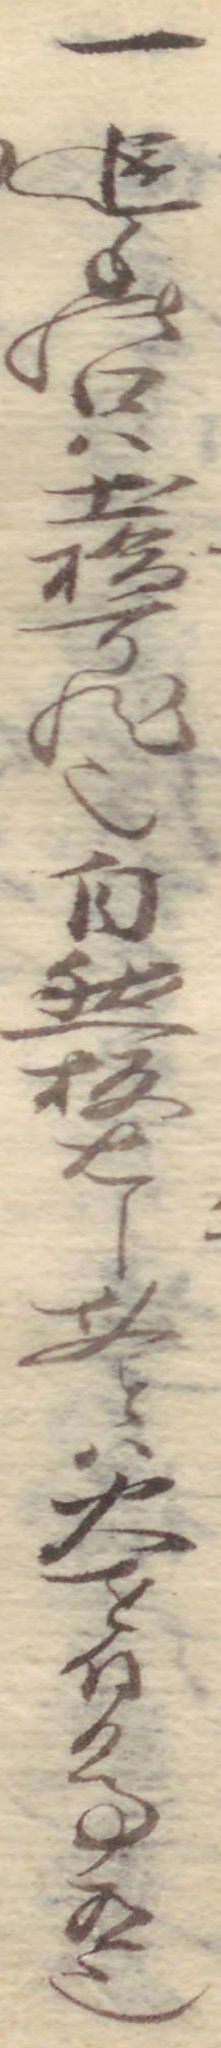一追手の口ハ土橋可然也自然板はしなとハ火を付る事有也
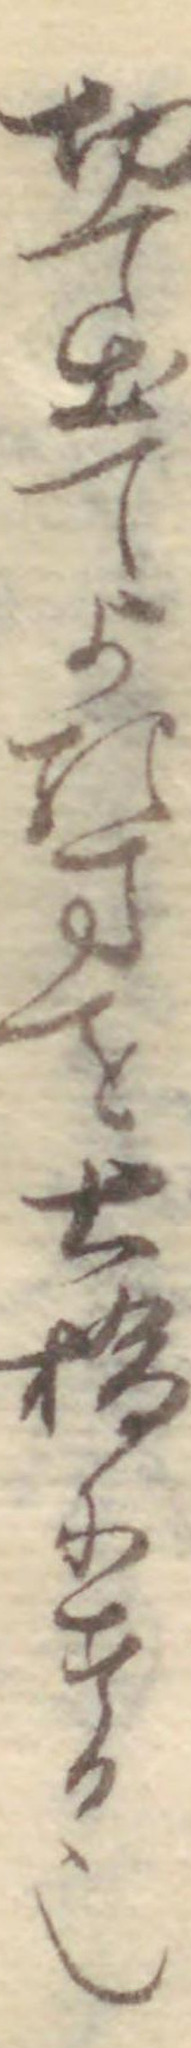切て出てよき方を土橋にする也
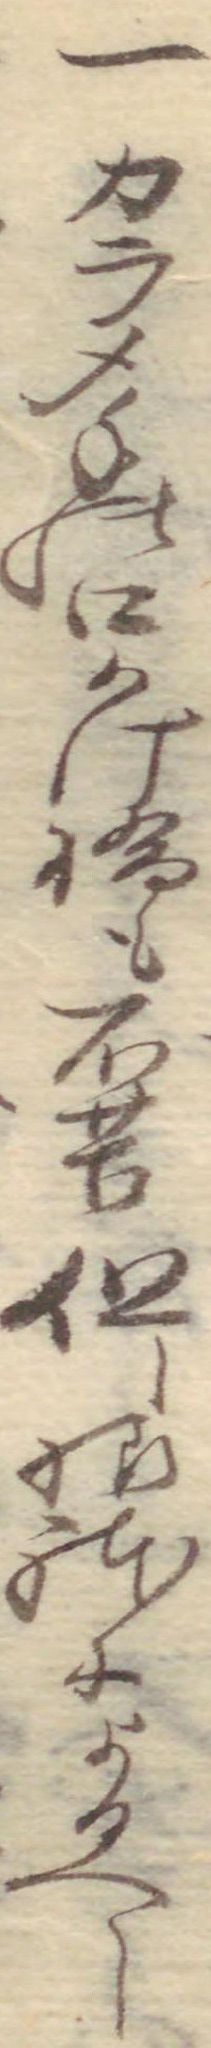一カラメ手の口かけ橋も不苦但様体によるへし
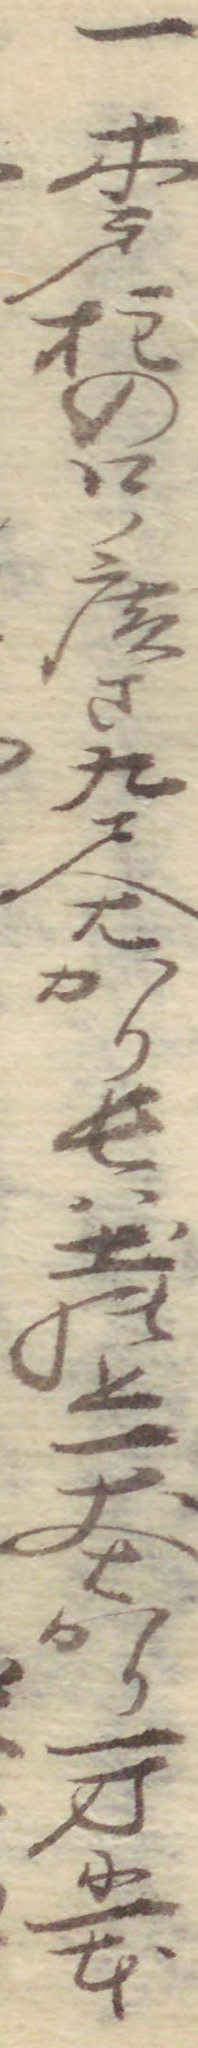一木戸柱の口ノ広さ九尺はかり長ハ土の上一丈はかり一方に一本
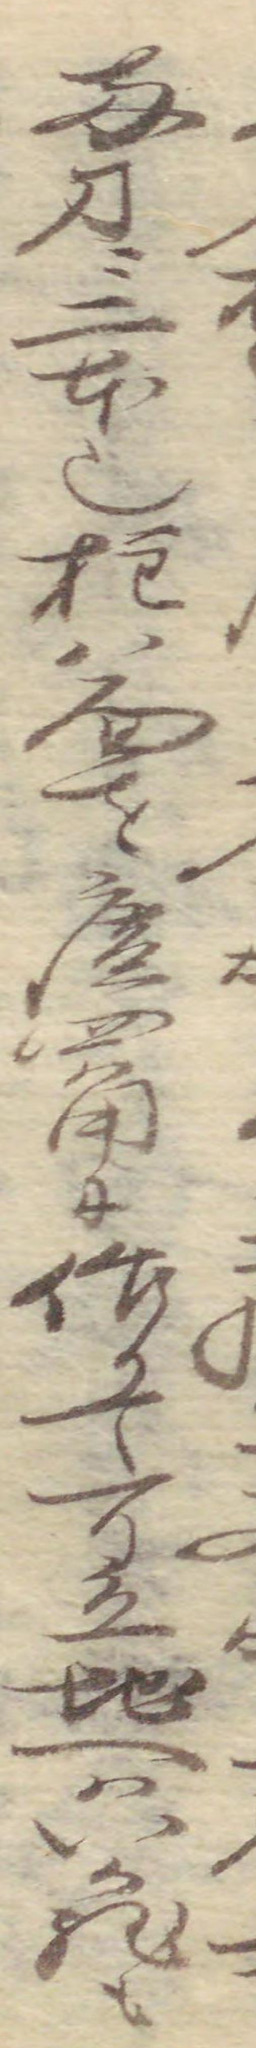両方ニ二本也柱ハ面を広四角に作りて可立地へハいか程も
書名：鶯宿雑記. 巻199-200
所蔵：国立国会図書館 National Diet Library, JAPAN
